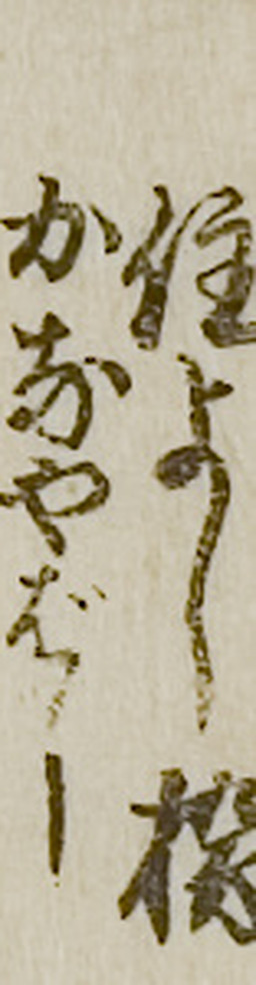かなやばし
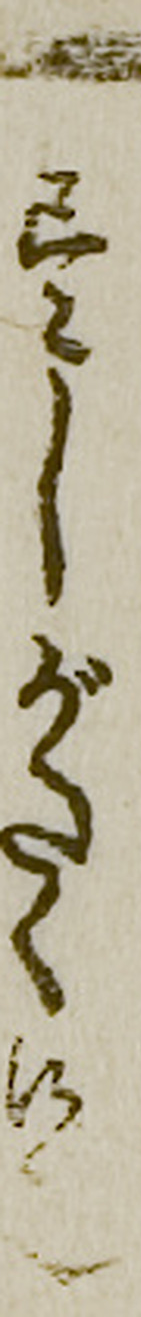尽しがたく候也
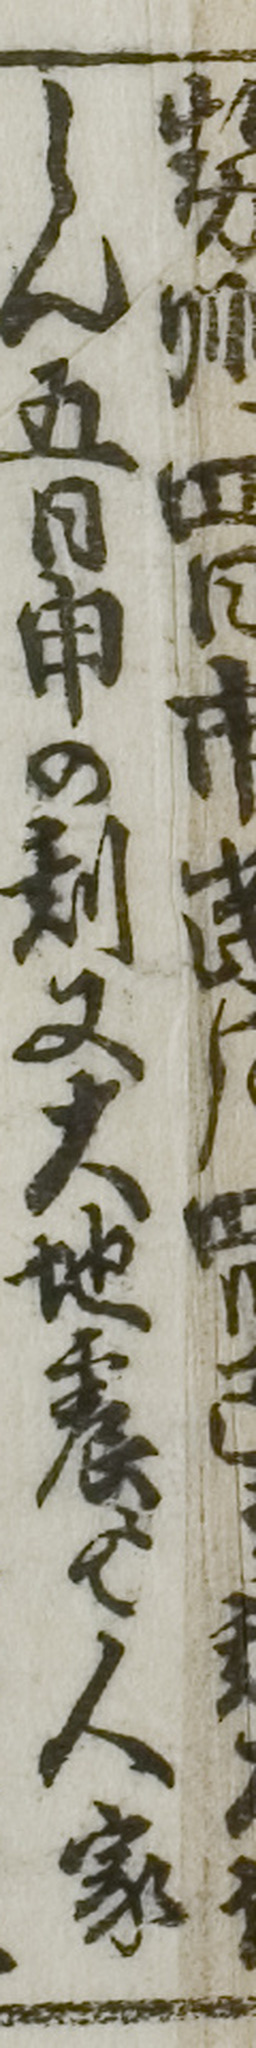しん五日申の刻又大地震にて人家
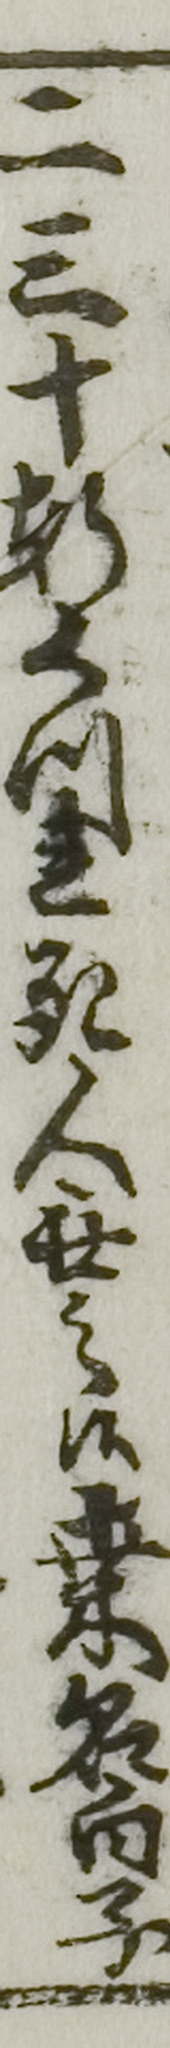二三十軒くつれ死人無之候桑名白子
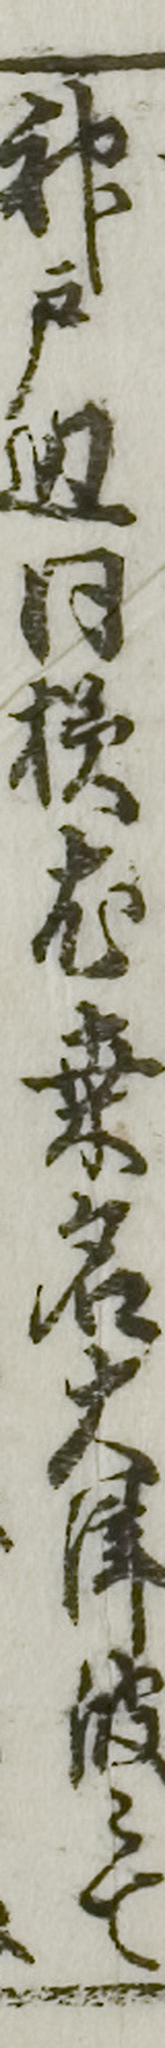神戸辺同様尤桑名大津波にて
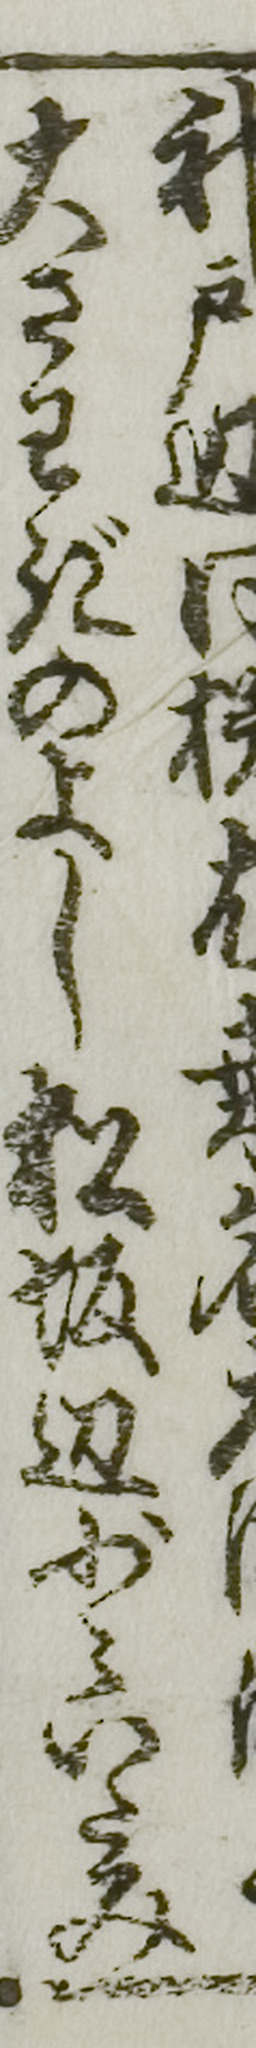大さわぎのよし松坂辺少々いたみ
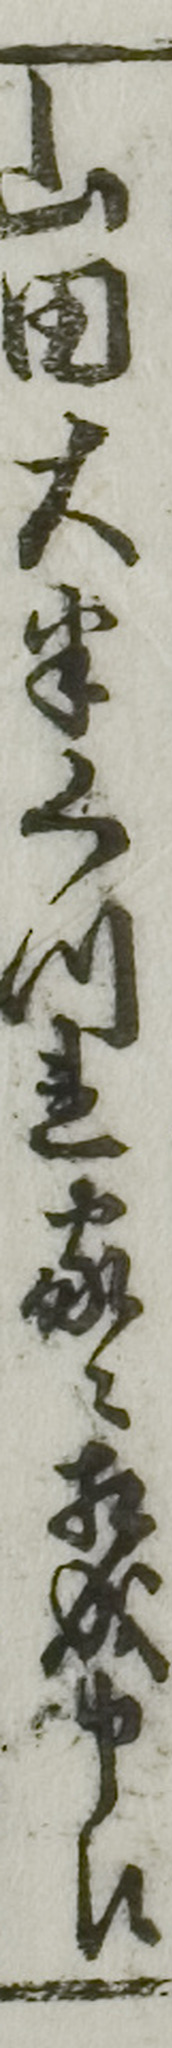山田大半くつれ家に相成申候
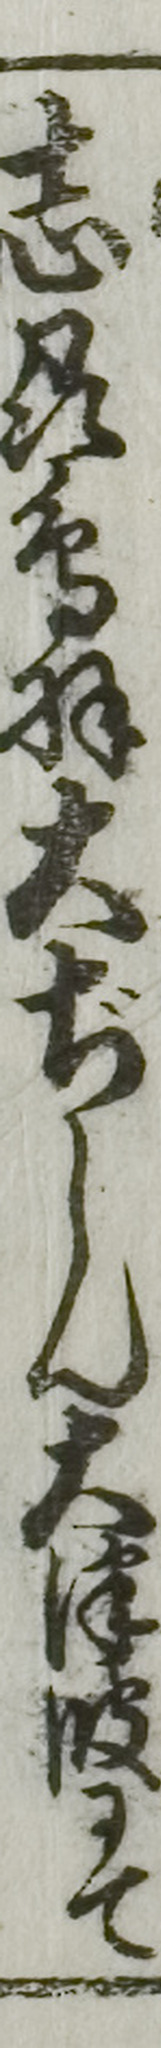志州鳥羽大ぢしん大津波にて
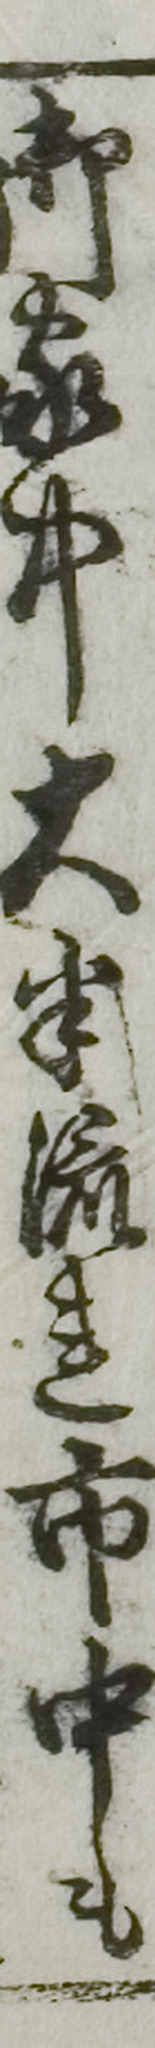御家中大半流れ市中も
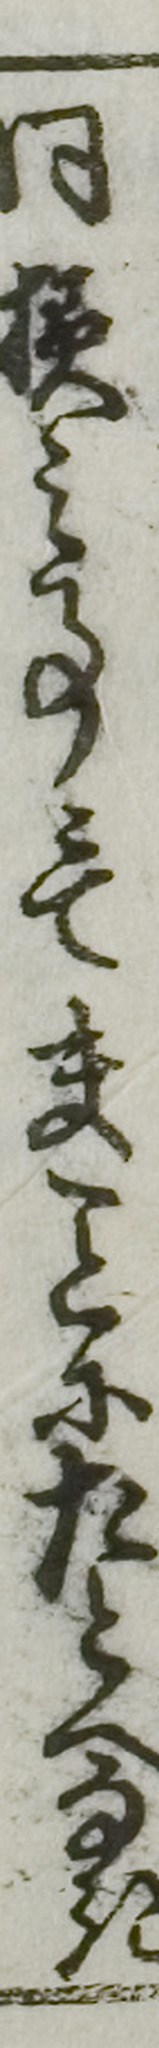同様の事にてまことにたとへなき
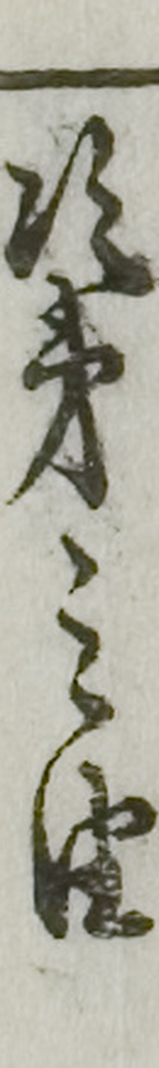次第の由
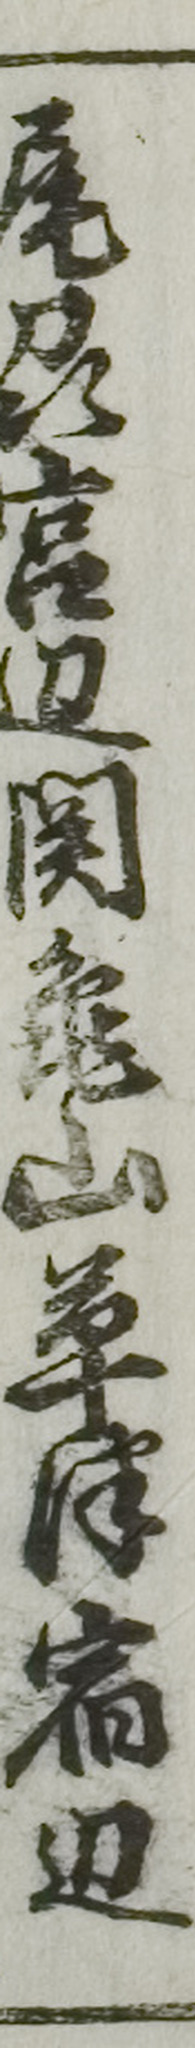尾州宮辺関亀山草津宿辺
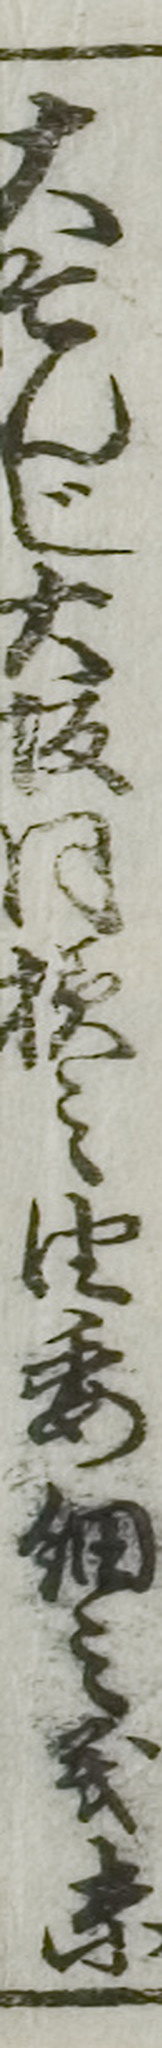大そんじ大坂同様の由委細の義未
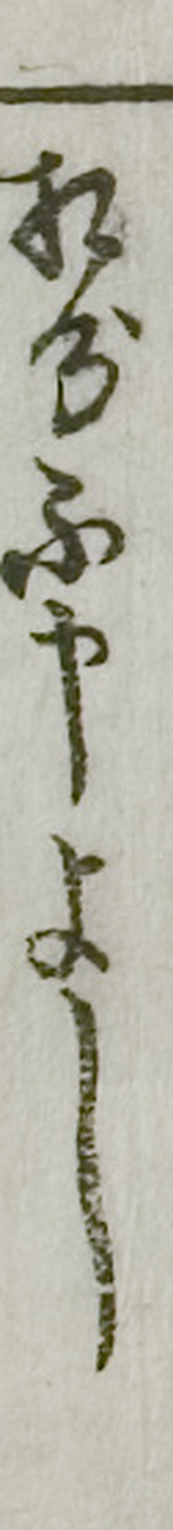相分不申よし
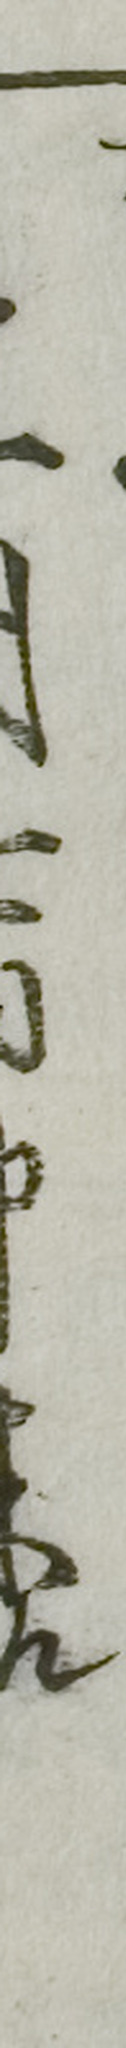十一月七日申来る
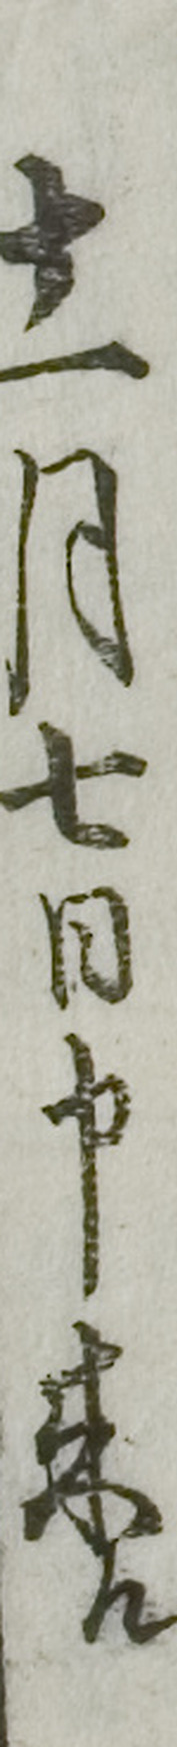十一月七日申来る
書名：東海道大阪辺大地震津波図
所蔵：東京大学総合図書館 General Library in the University of Tokyo, JAPAN
